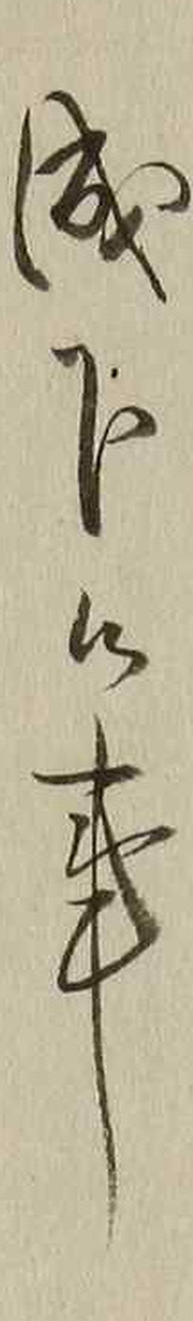成下候事
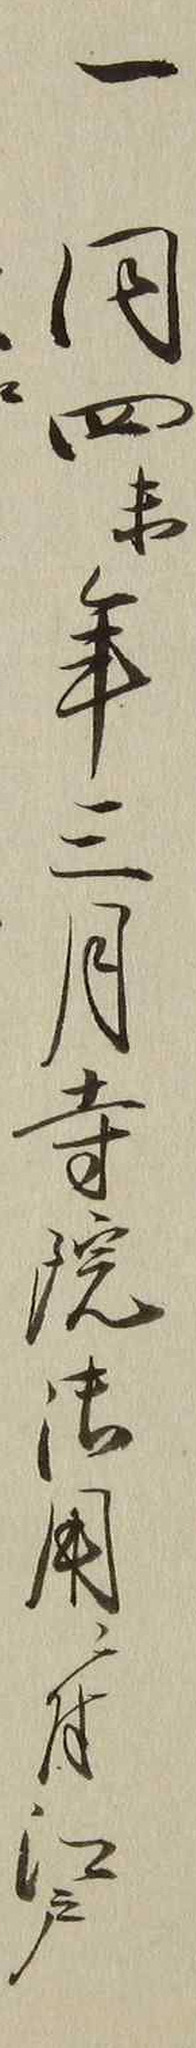一同四未年三月寺院御用に付江戸
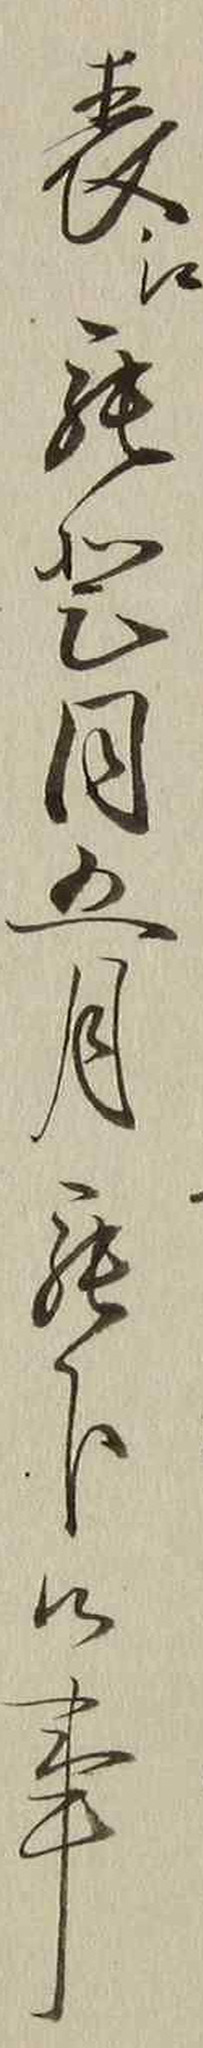表江罷登同五月罷下候事
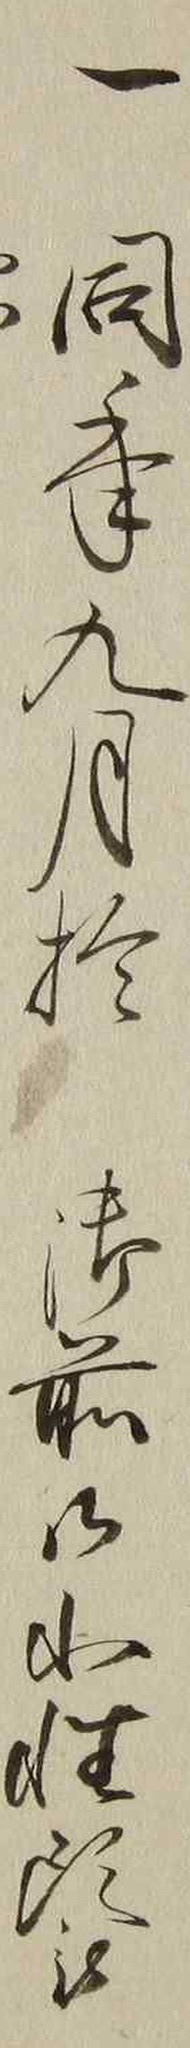一同年九月於御前御小性頭被
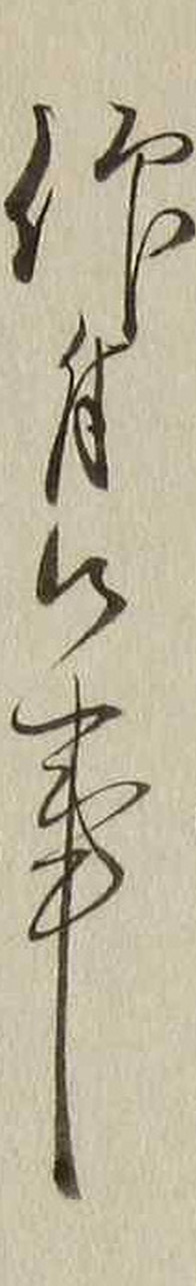仰付候事
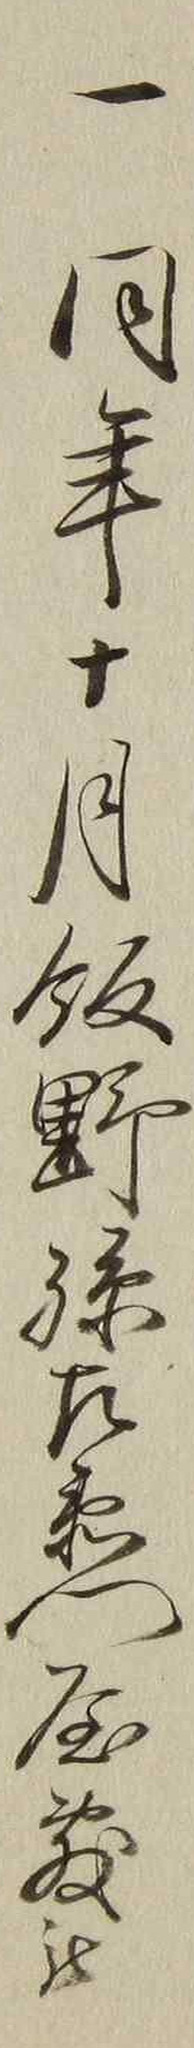一同年十月飯野孫左衛門屋敷被
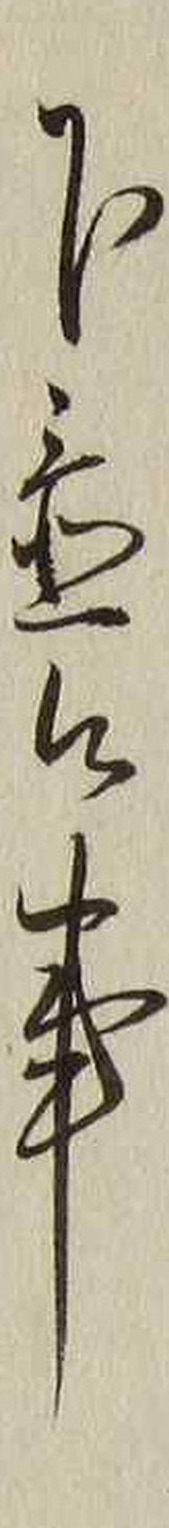下置候事
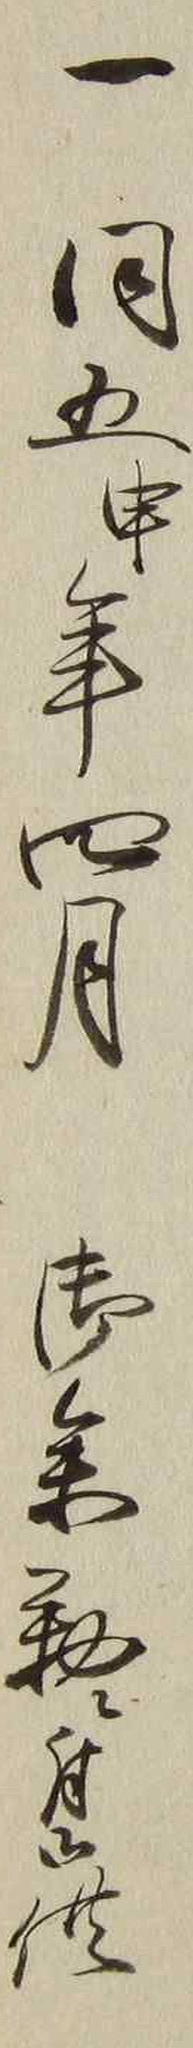一同五申年四月御参勤に付御供
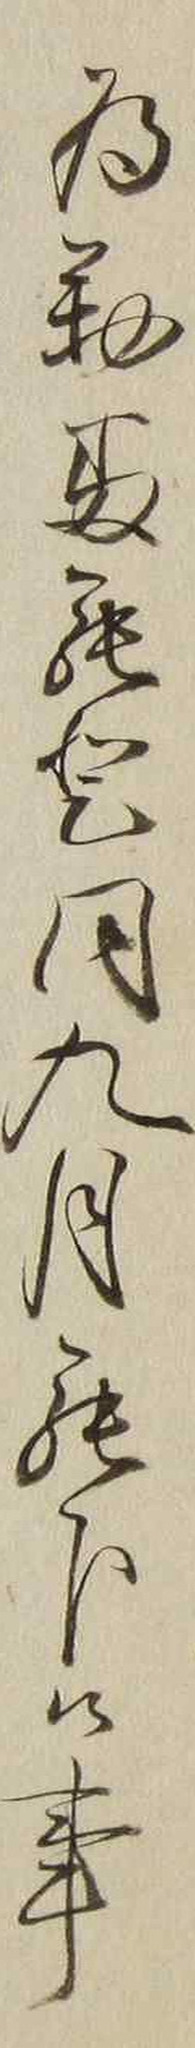為勤番罷登同九月罷下候事
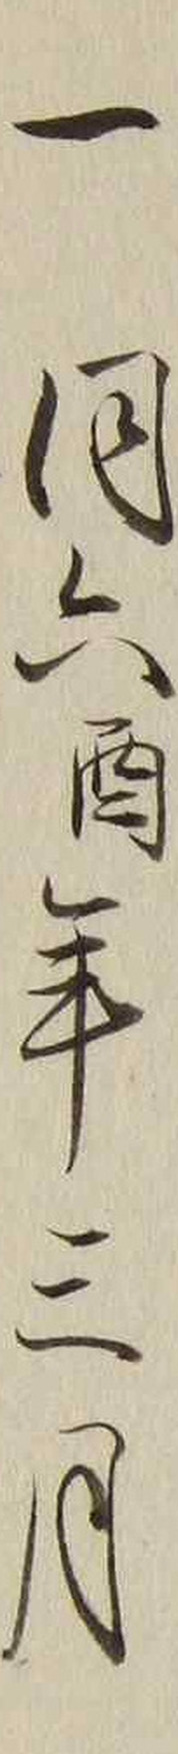一同六酉年三月
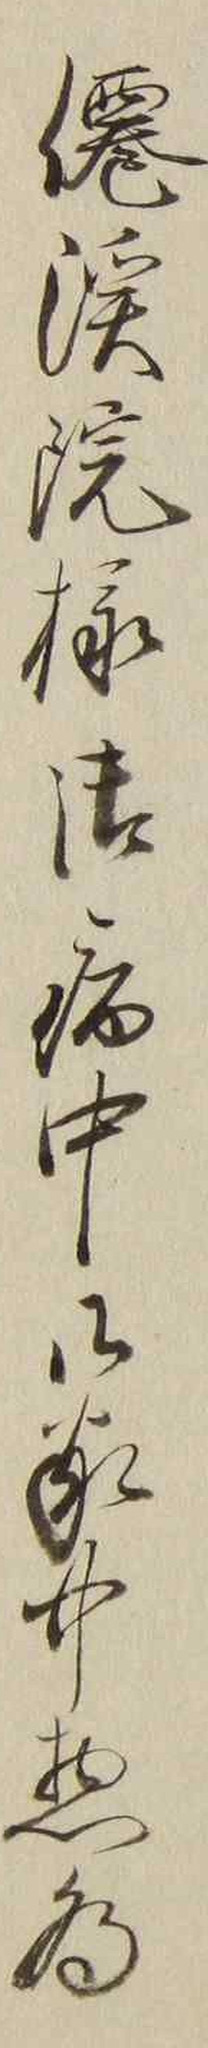僊渓院様御病中御家中惣為

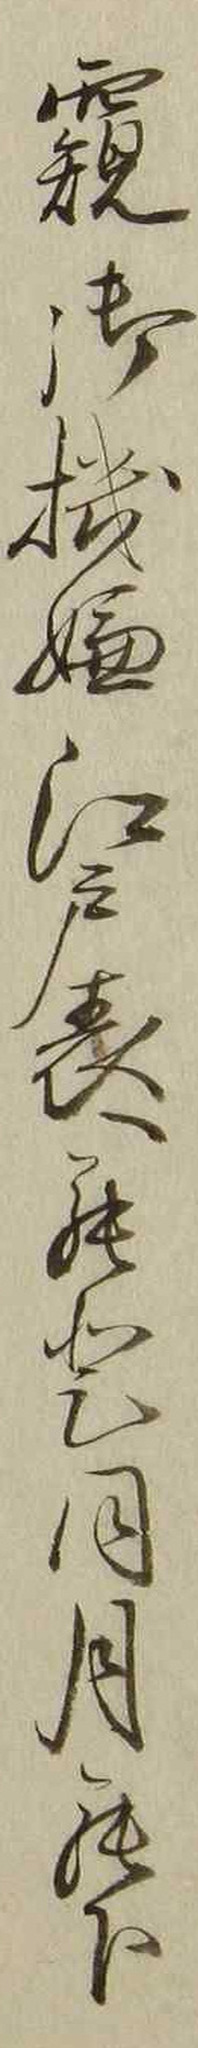窺御機嫌江戸表へ罷登同月罷下
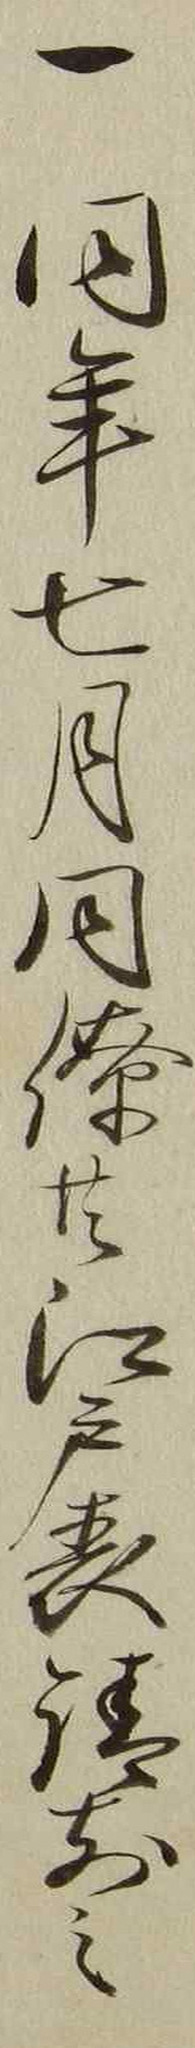一同年七月同僚共江戸表請前之
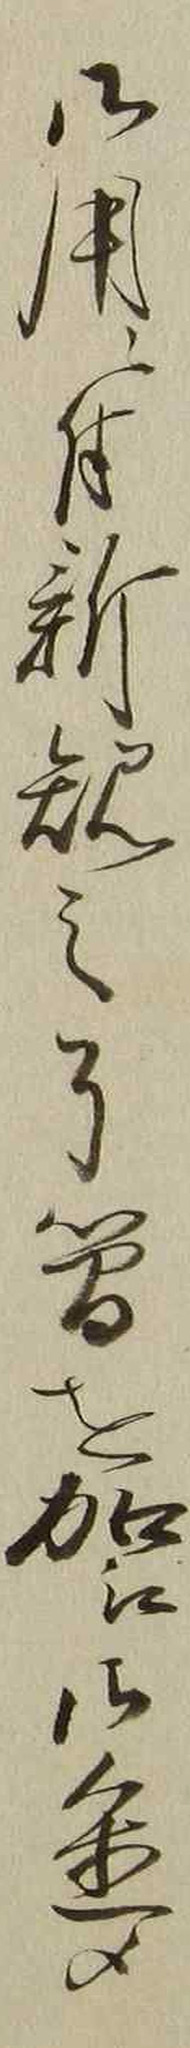御用に付新規之了簡を加江御置〆
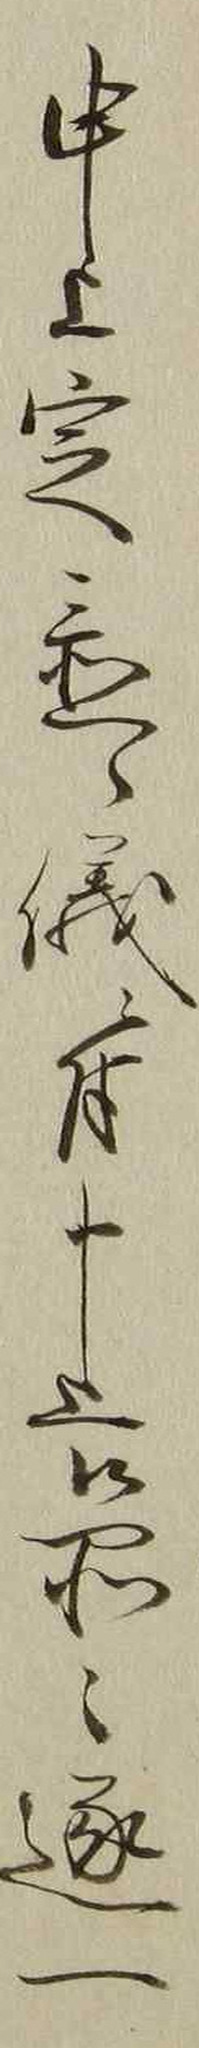申上定置之儀に付申上候所々逐一
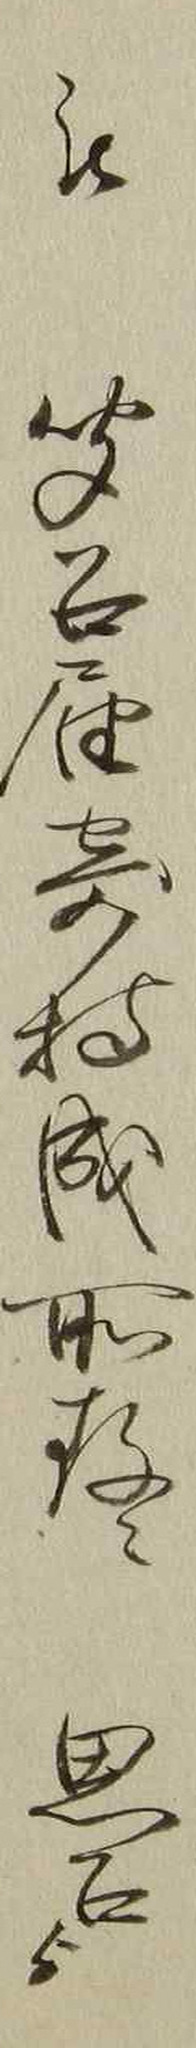被聞召届寄付成所存に思召ゟ
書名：諸士系譜　巻之103　か之部11
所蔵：会津若松市立会津図書館
